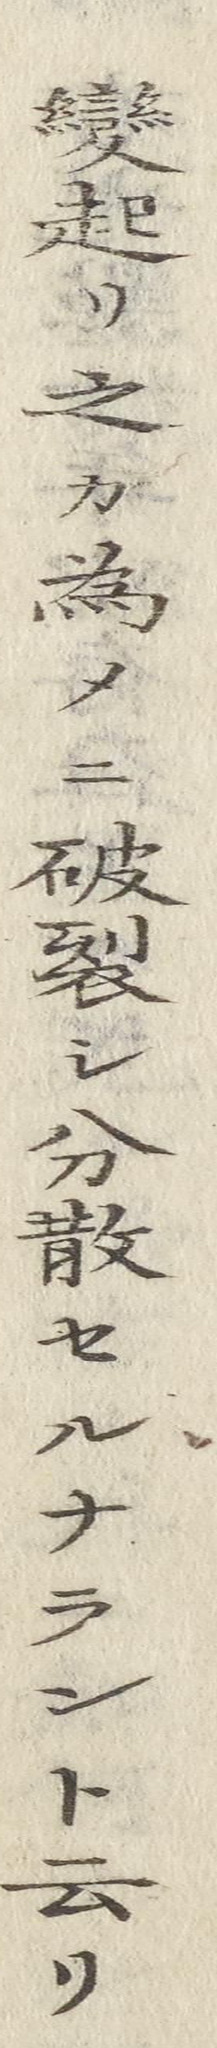変起リ之カ為メニ破裂シ分散セルナラント云リ
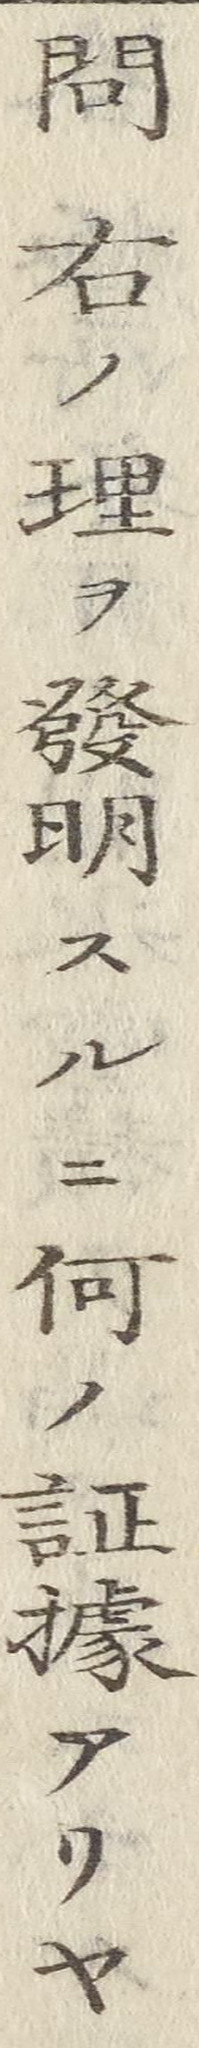問右ノ理ヲ発明スルニ何ノ証拠アリヤ
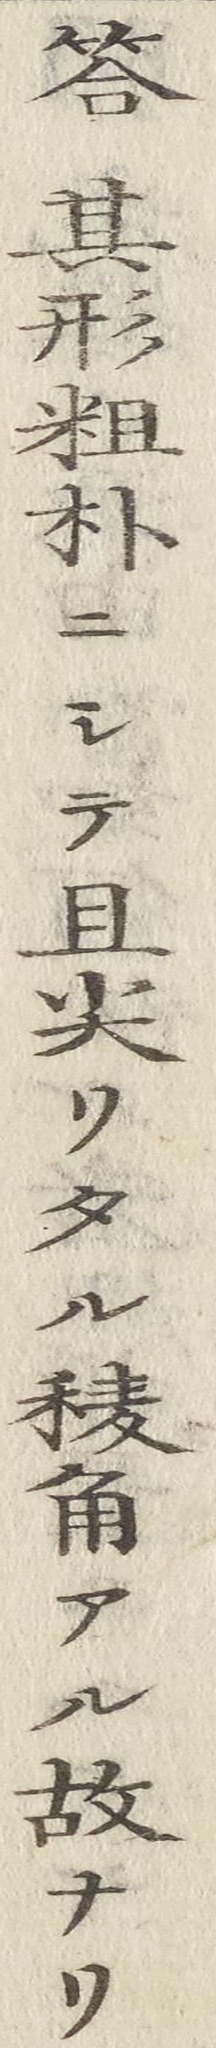答其形粗朴ニシテ且尖リタル稜角アル故ナリ
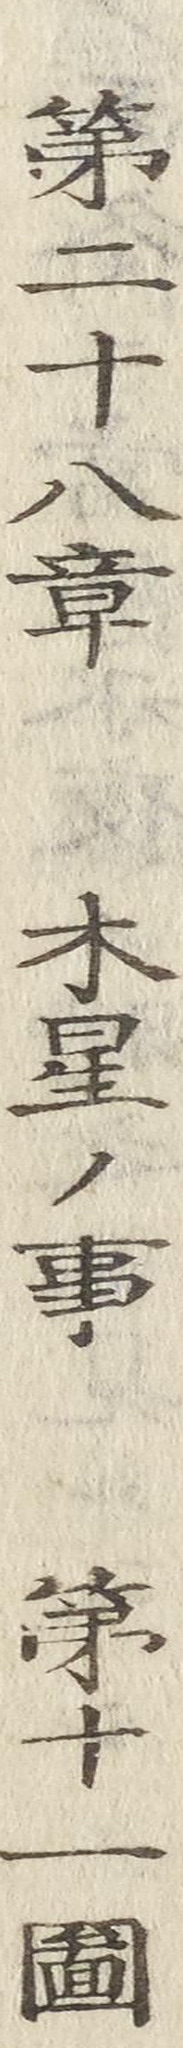第二十八章木星ノ事第十一図
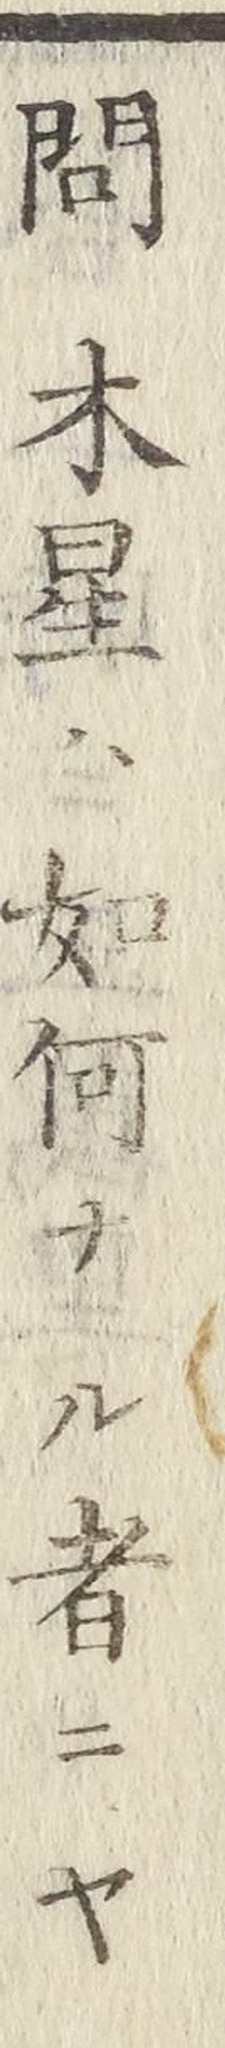問木星ハ如何ナル者ニヤ
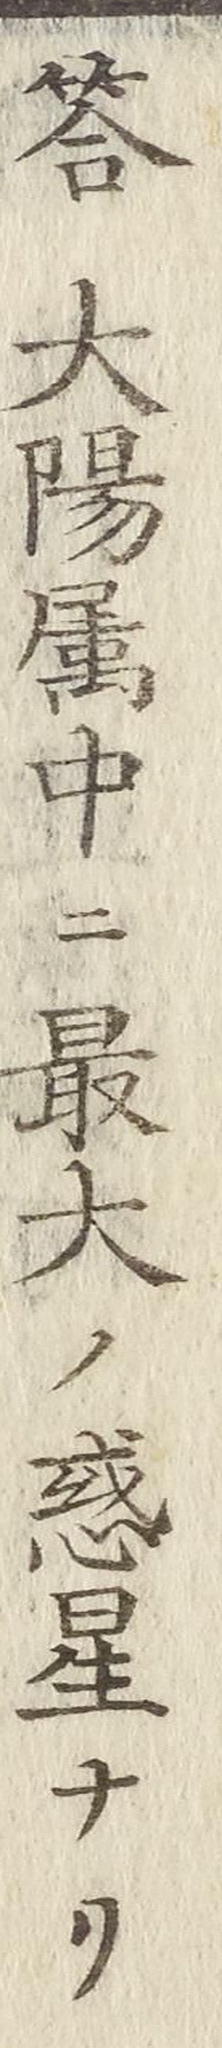答大陽属中ニ最大ノ惑星ナリ
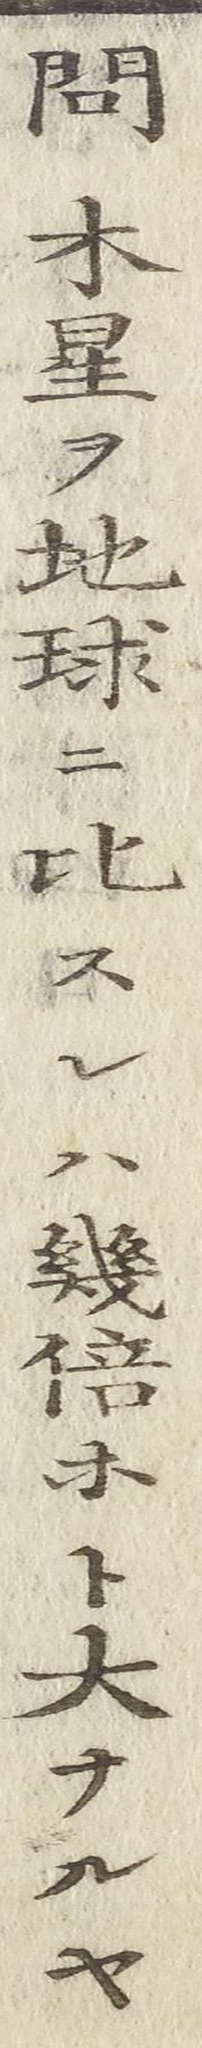問木星ヲ地球ニ比スレハ幾倍ホト大ナルヤ
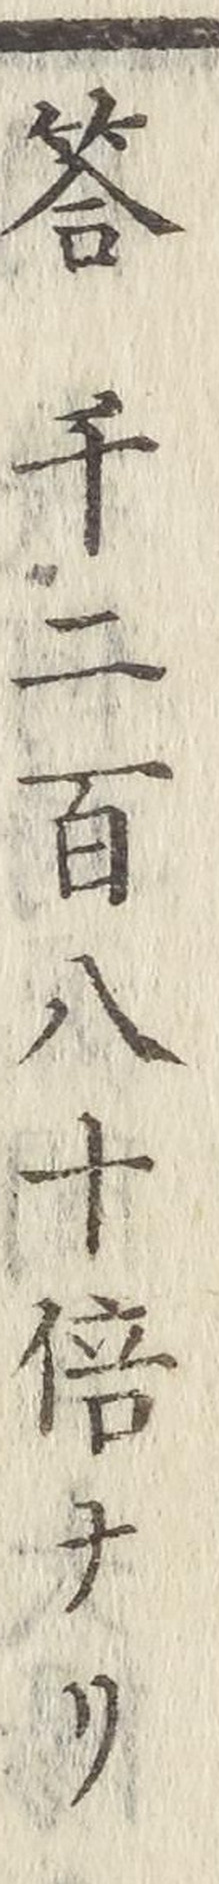答千二百八十倍ナリ
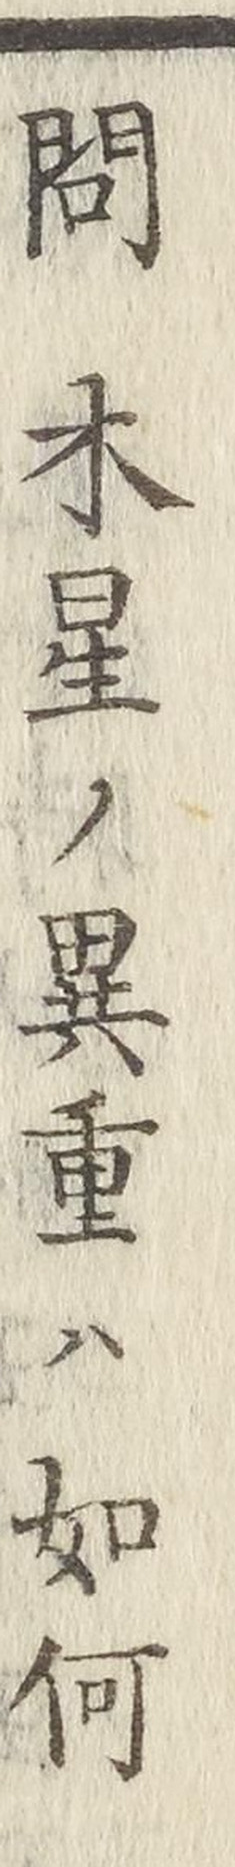問木星ノ異重ハ如何
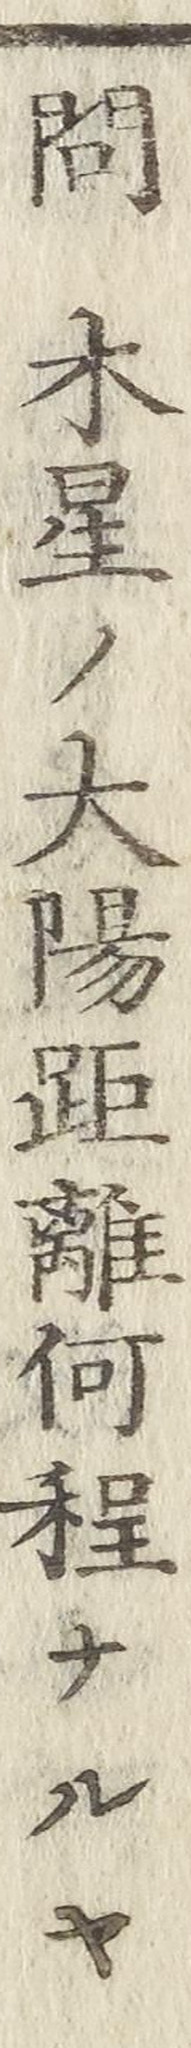問木星ノ大陽距離何程ナルヤ
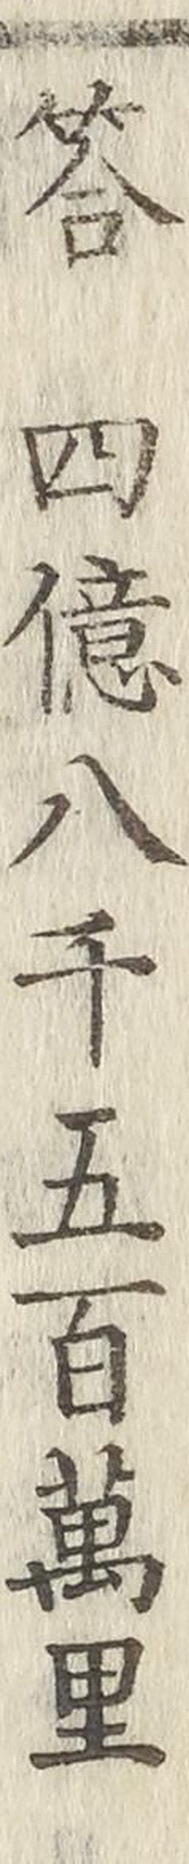答四億八千五百万里
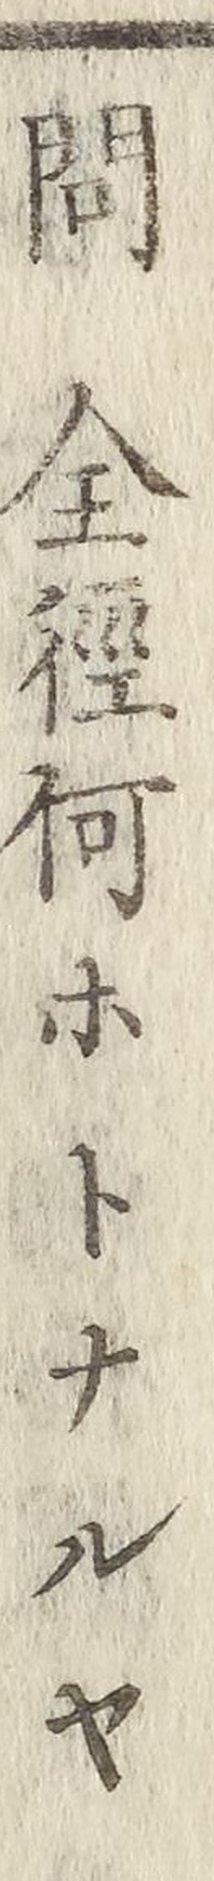問全径何ホトナルヤ
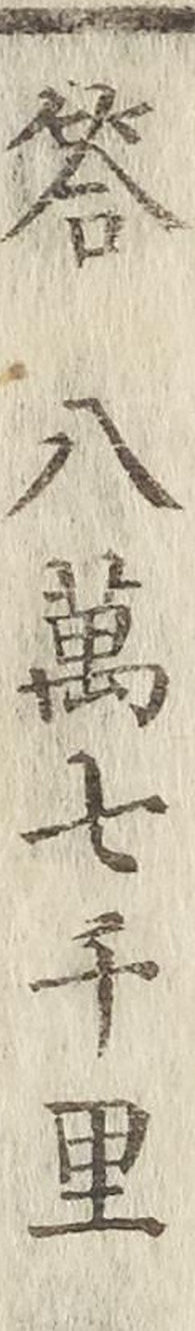答八万七千里

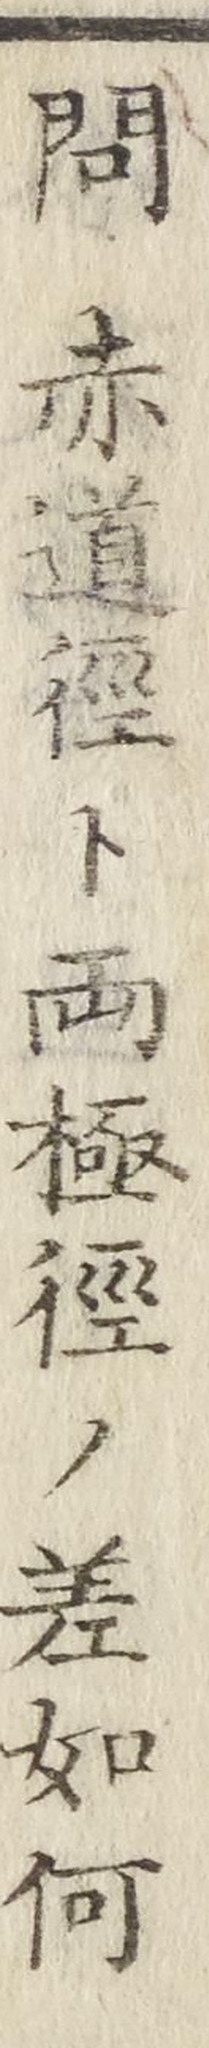問赤道径ト両極径ノ差如何
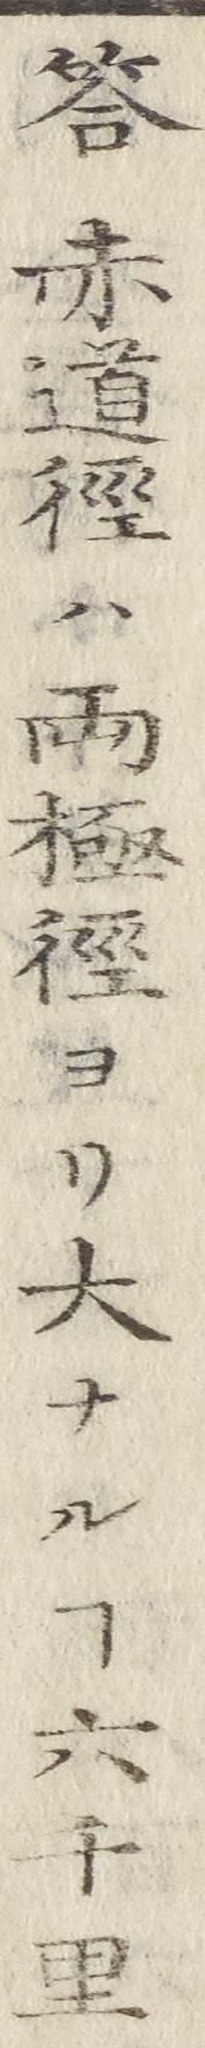答赤道径ハ両極径ヨリ大ナルコト六千里
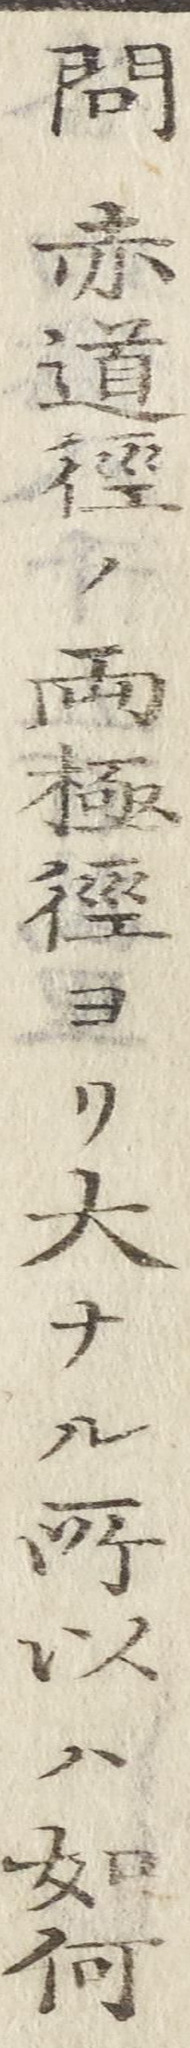問赤道径ノ両極径ヨリ大ナル所以ハ如何
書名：星学圖説　上
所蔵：東京大学地震研究所図書室 Earthquake Research Institute Library, The University of Tokyo, JAPAN
